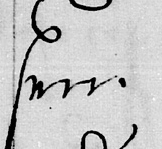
sen.
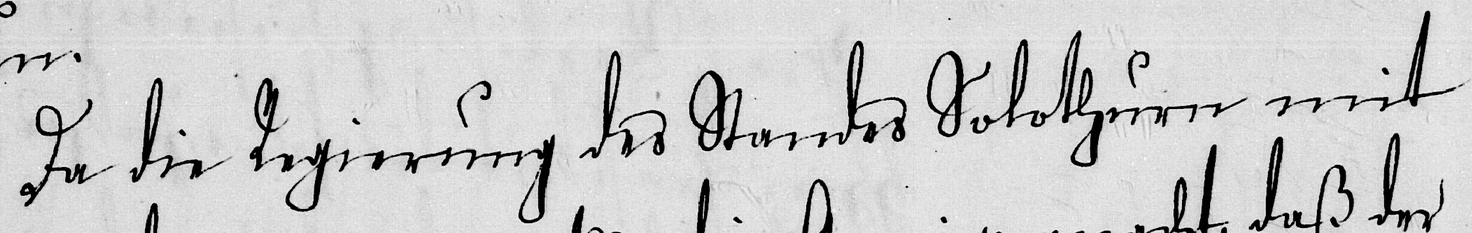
Da die Regierung des Standes Solothurn mit
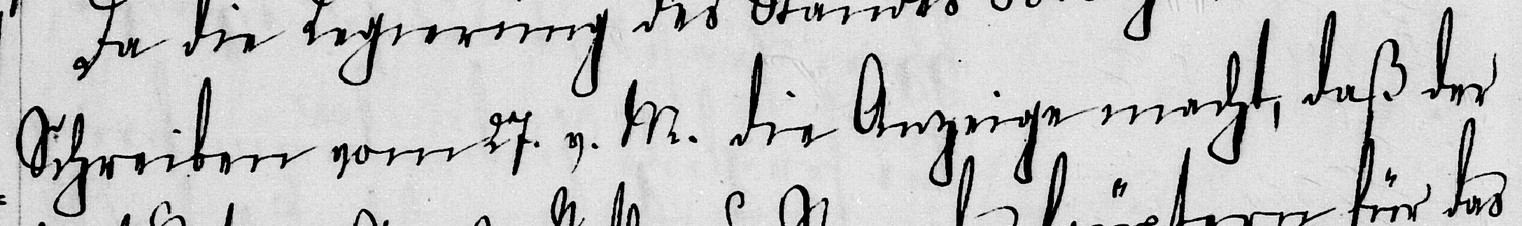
Schreiben vom 27. v. M. die Anzeige macht, daß der
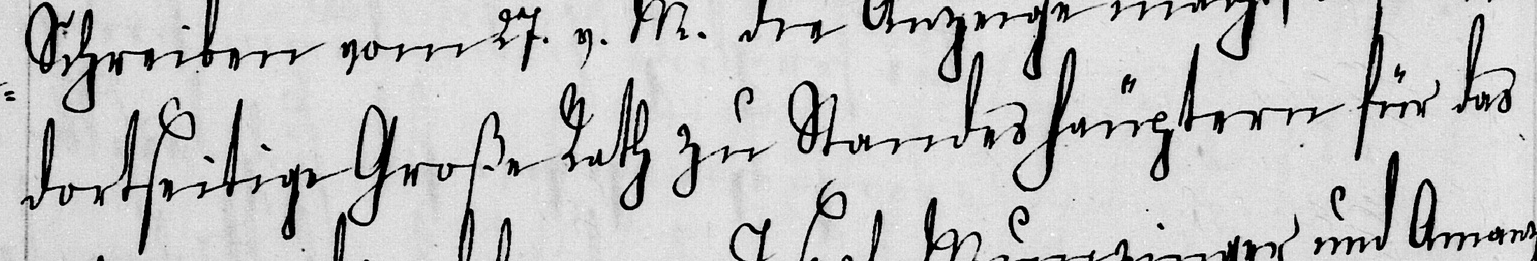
dortseitige Große Rath zu Standeshäuptern für das
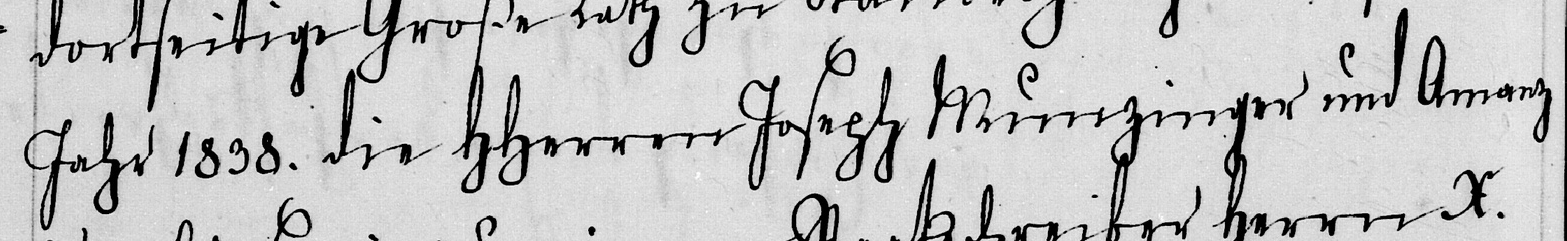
Jahr 1838. die HHerren Joseph Munzinger und Amanz
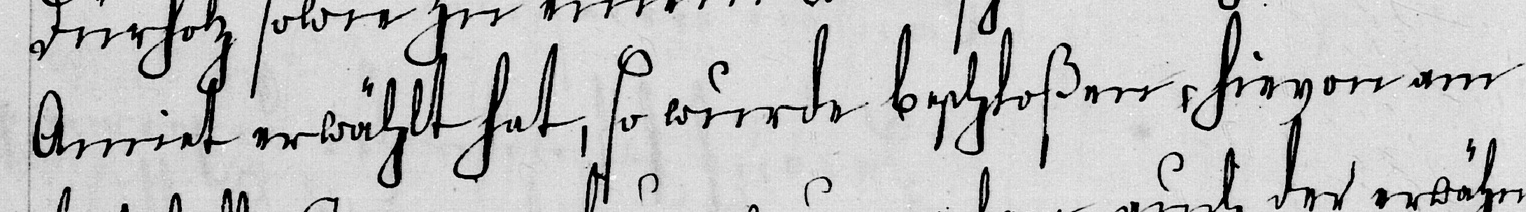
Amiet erwählt hat, so wurde beschloßen, hievon am
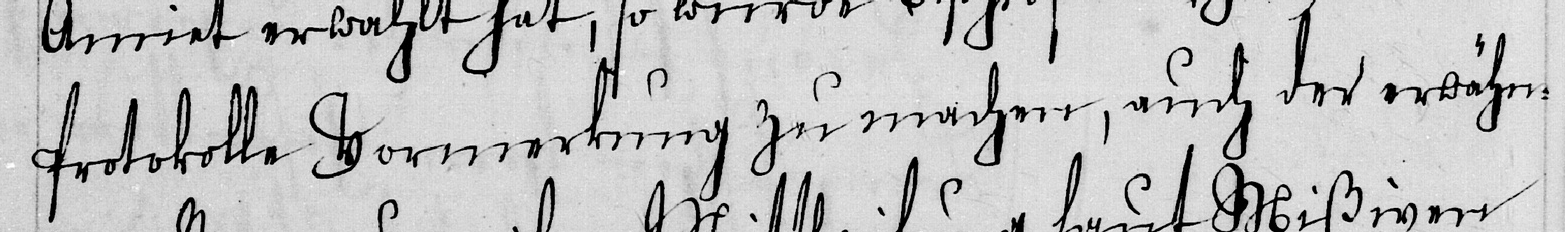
Protokolle Vormerkung zu machen, auch der erwähn¬
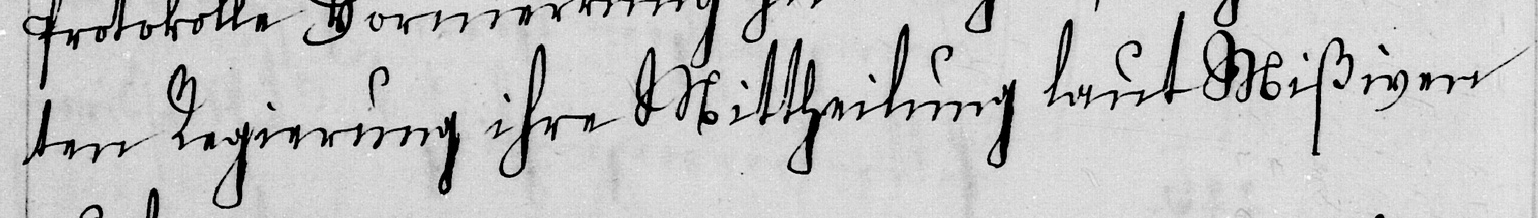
ten Regierung ihre Mittheilung laut Mißiven
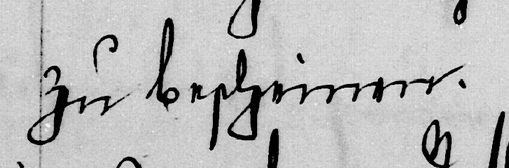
zu bescheinen.
